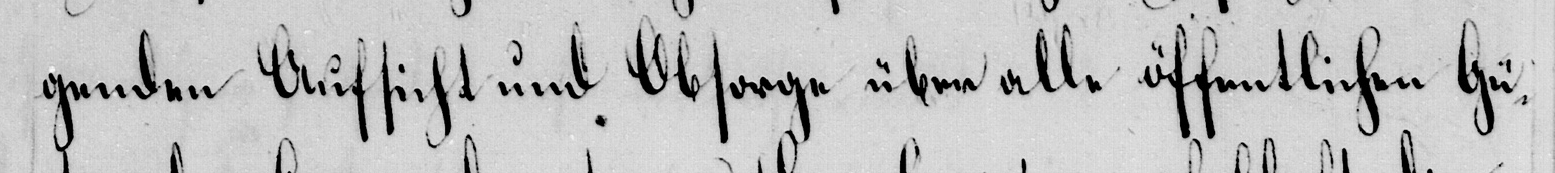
genden Aufsicht und Obsorge über alle öffentlichen Gü¬
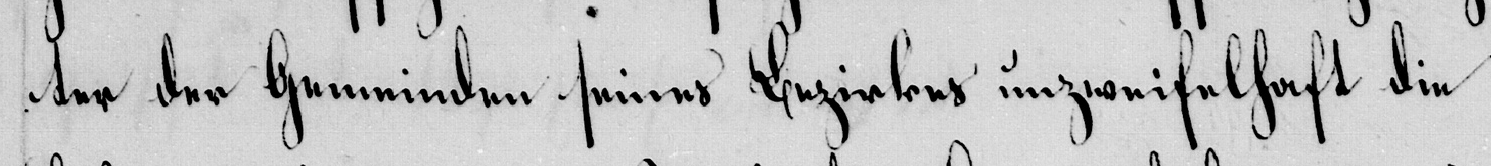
ter der Gemeinden seines Bezirkes unzweifelhaft die
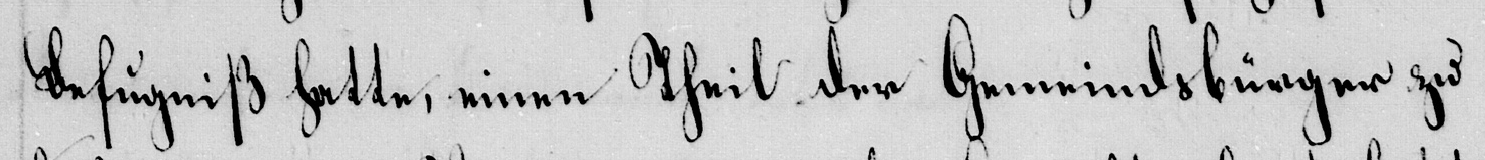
Befugniß hatte, einen Theil der Gemeindsbürger zu
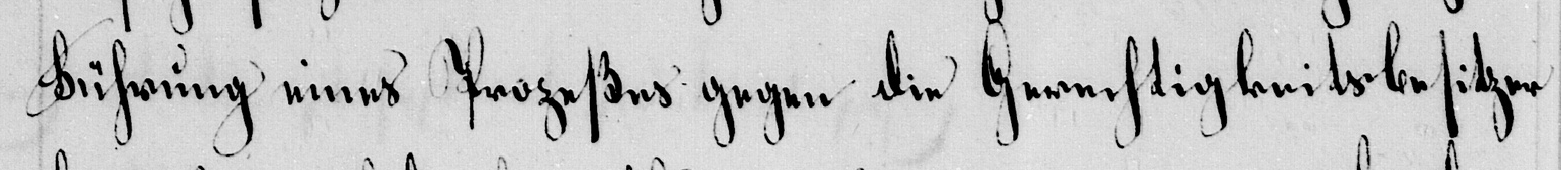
Führung eines Prozeßes gegen die Gerechtigkeitsbesitzer
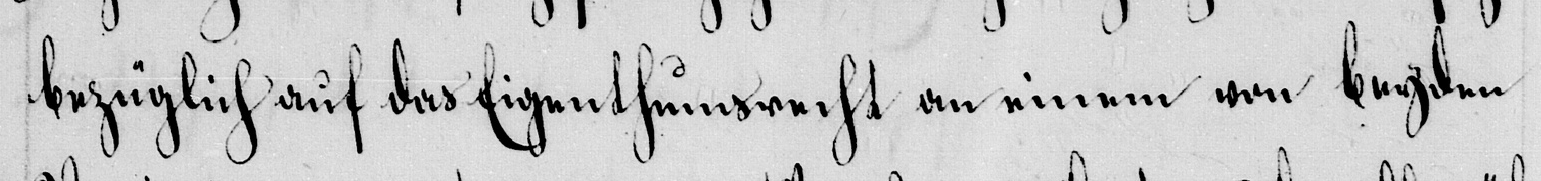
bezüglich auf das Eigenthumsrecht an einen von beyden
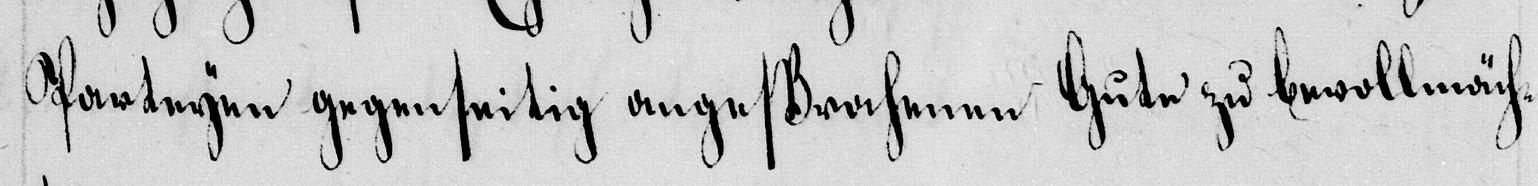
Parteyen gegenseitig angesprochenen Gute zu bevollmäch¬
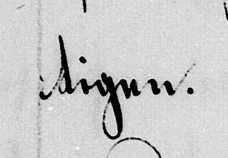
tigen.
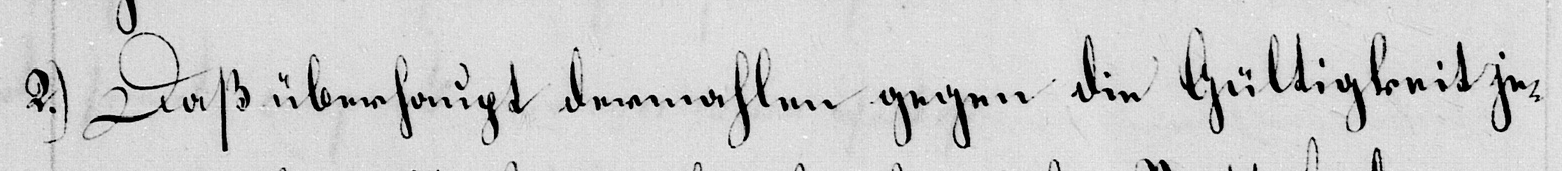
2.) Daß überhaupt dermahlen gegen die Gültigkeit je¬
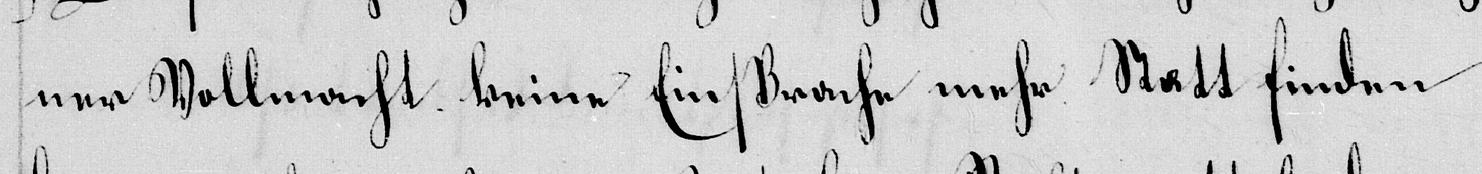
ner Vollmacht keine Einsprache mehr Statt finden
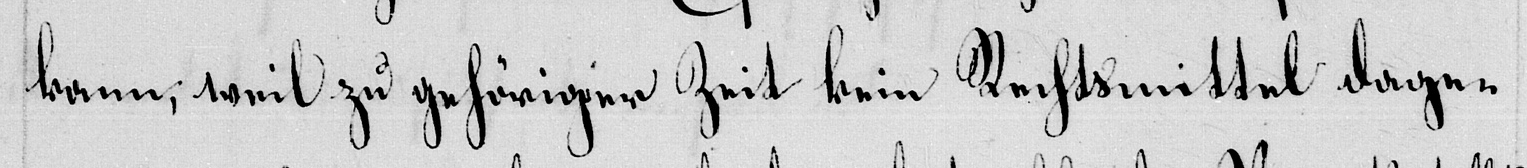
kann, weil zu gehöriger Zeit kein Rechtsmittel dage¬
